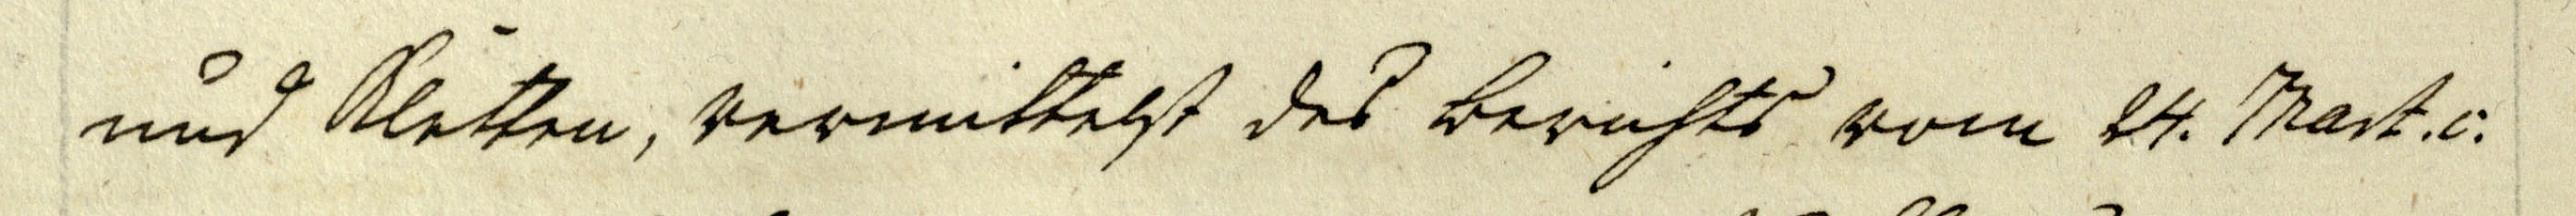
und Kletten, vermittelst des Berichts vom 24. Mart c.
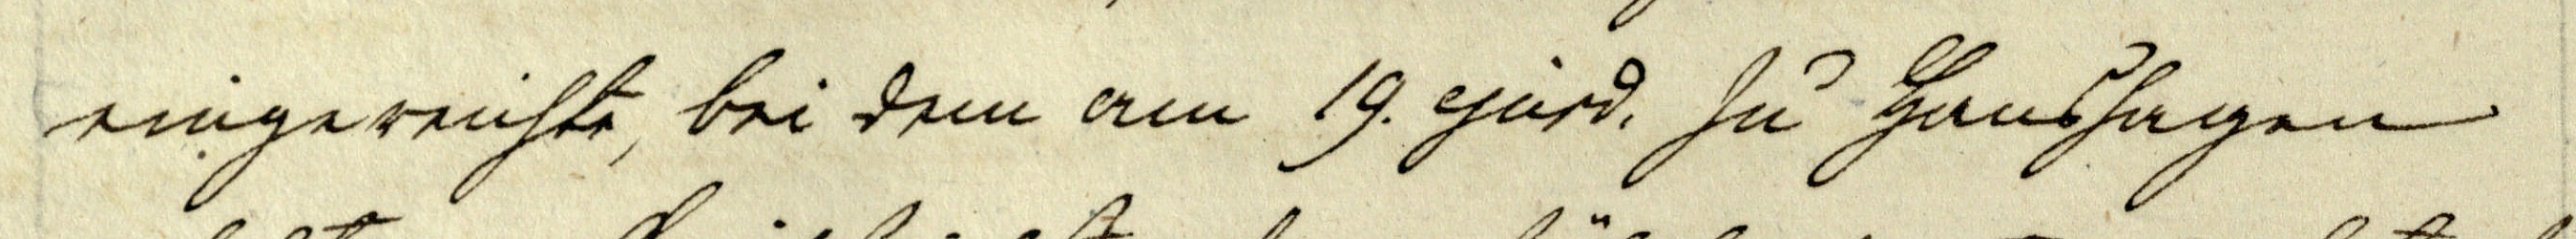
eingereichte, bei dem am 19. ejusd. zu Hanshagen
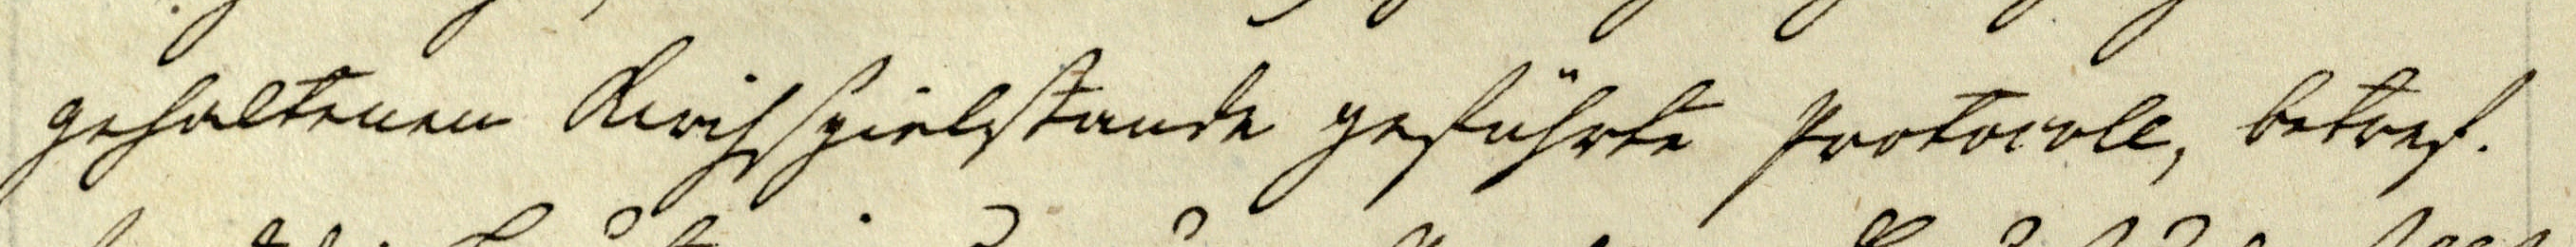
gehaltenen Kirchspielstande geführte Protocoll, betref¬
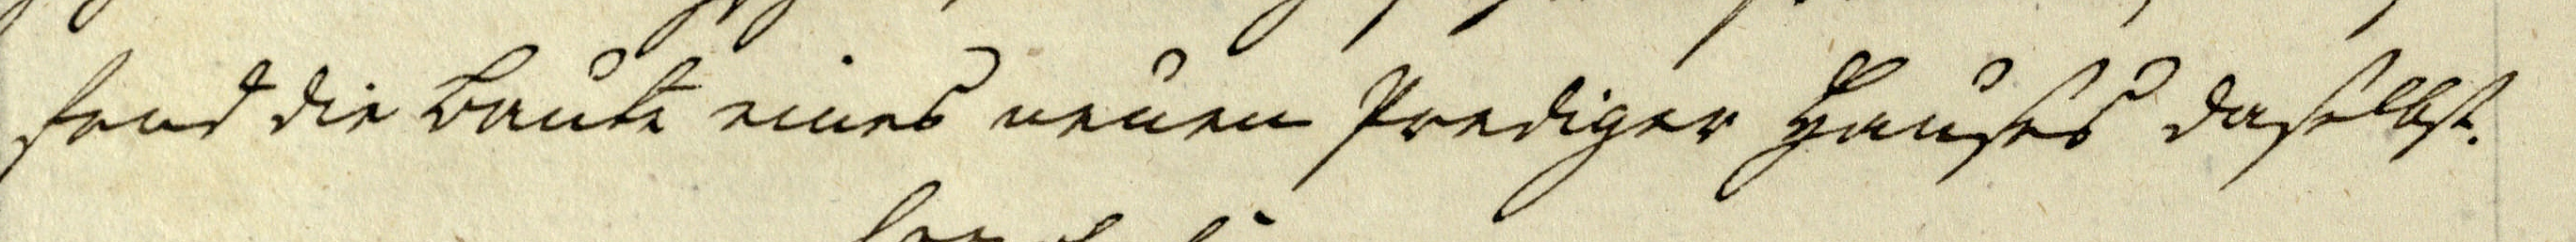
fend die Baute eines neuen Prediger Hauses daselbst.
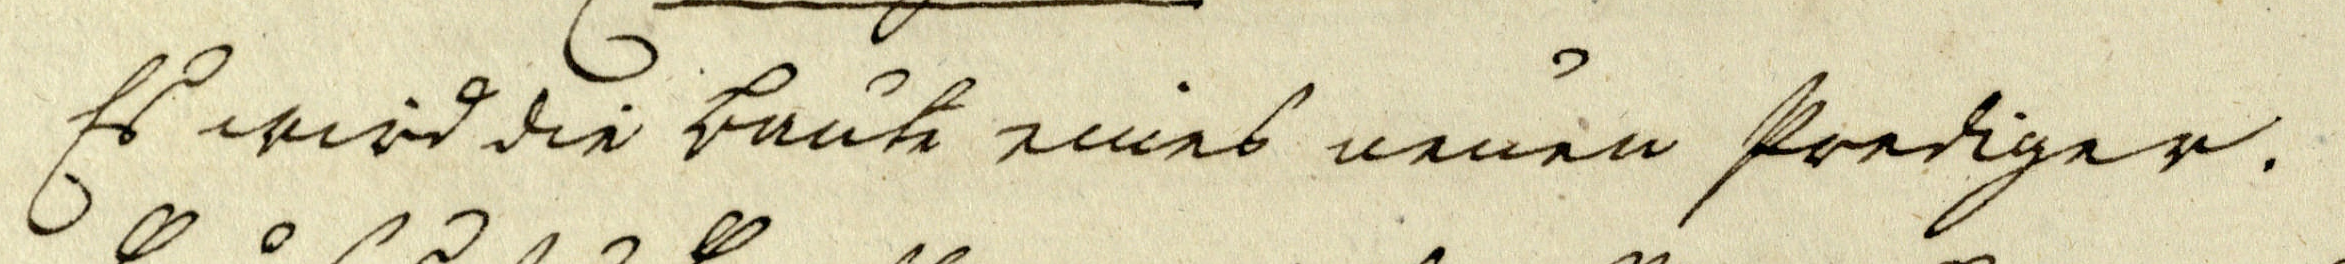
Es wird die Baute eines neuen Prediger
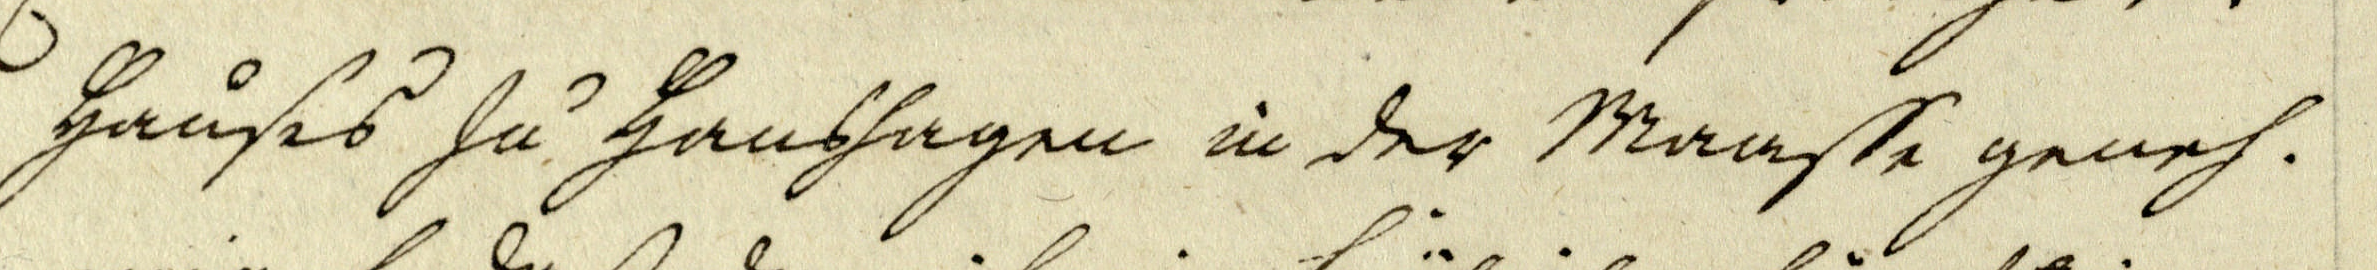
Hauses zu Hanshagen in der Maasse geneh¬
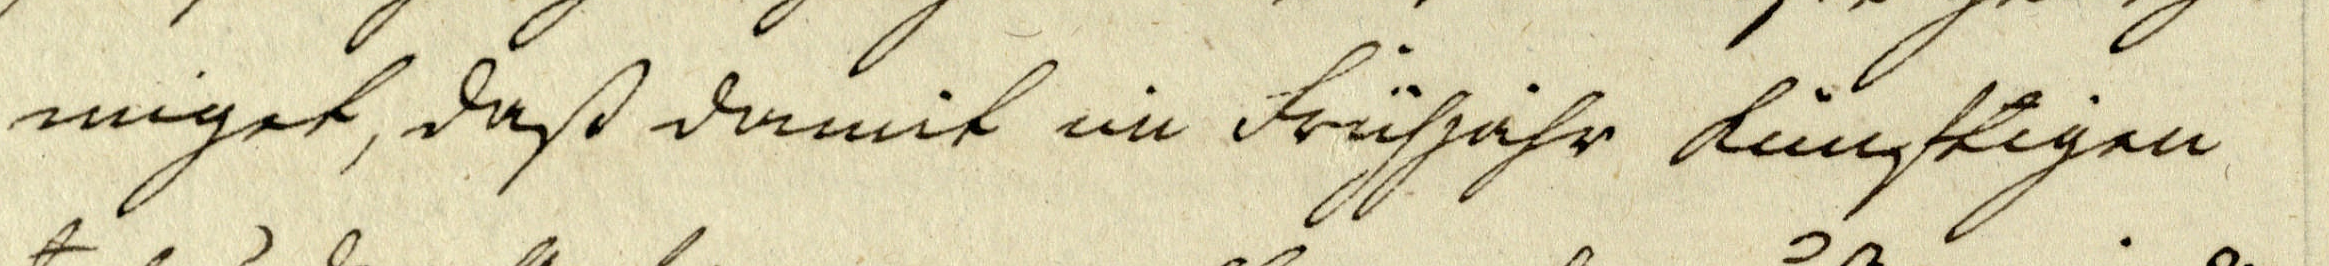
miget, daß damit im Frühjahr künftigen
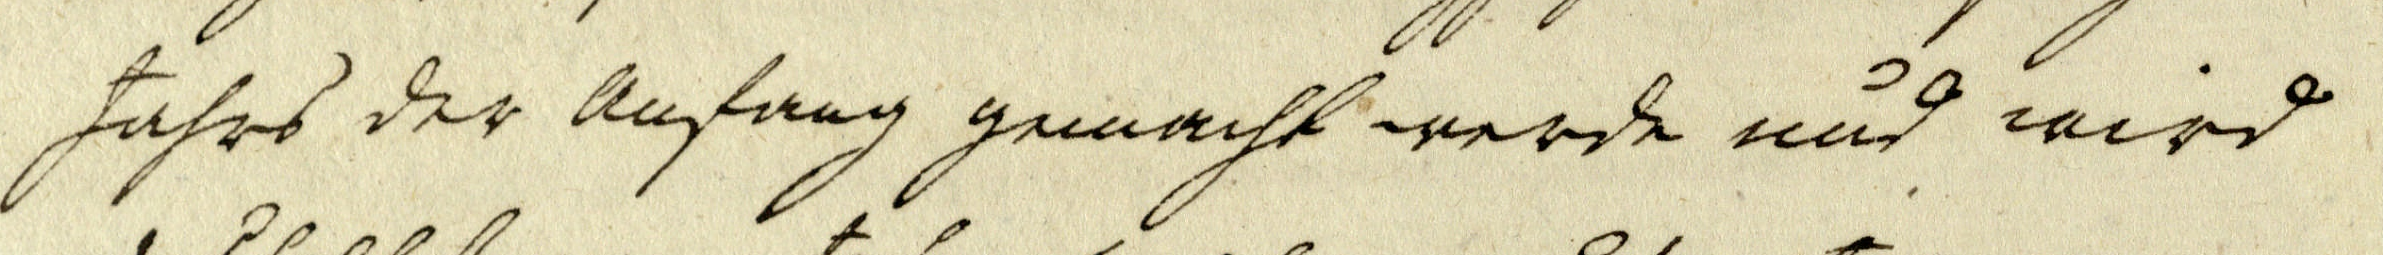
Jahrs der Anfang gemacht werde und wird
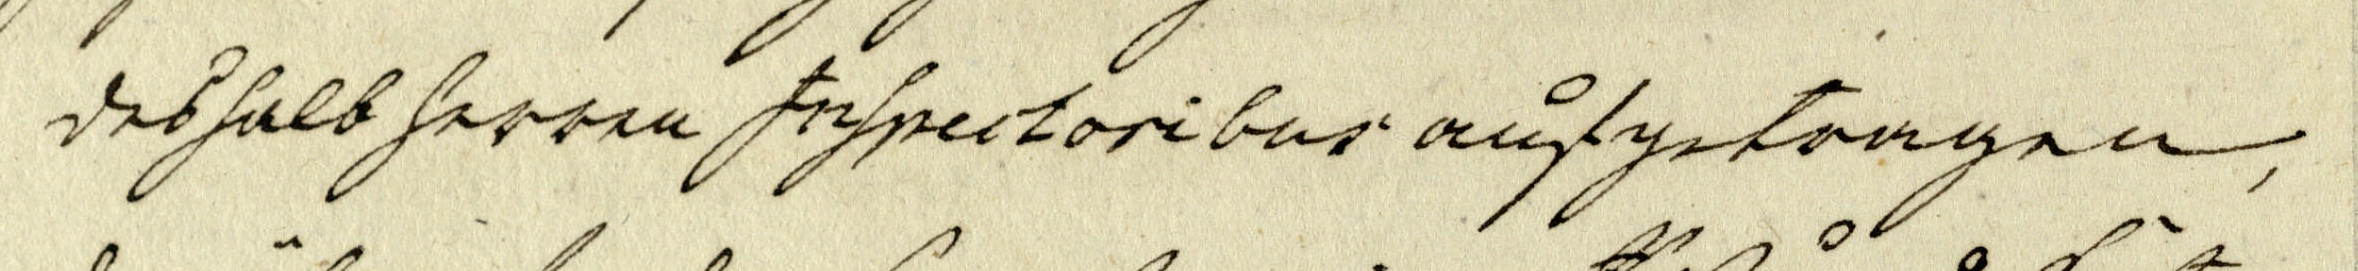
deshalb Herren Inspectoribus auf getragen,
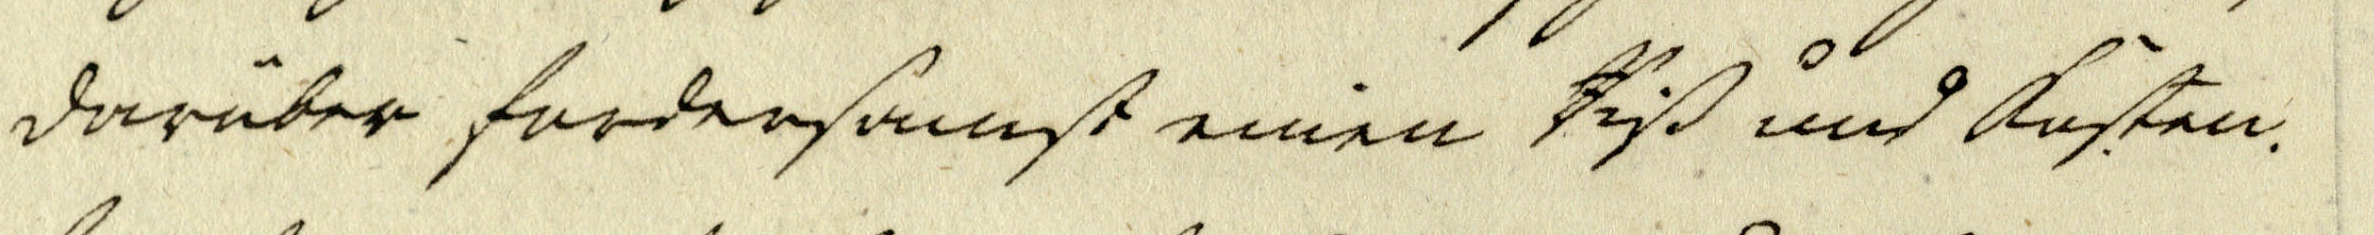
darüber fordersamst einen Riß und Kosten¬
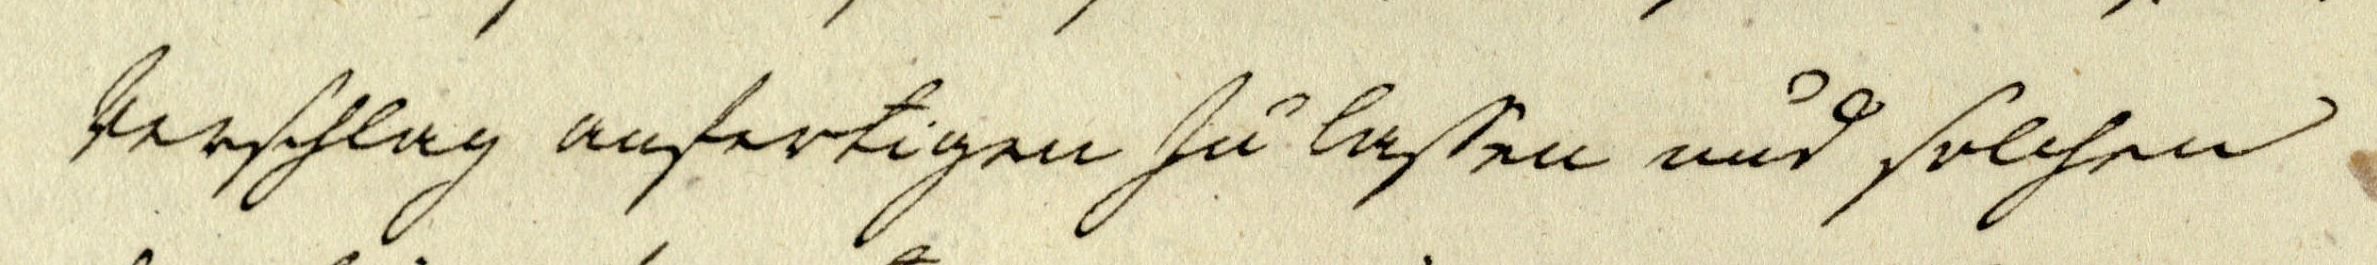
Verschlag anfertigen zu lassen und solchen
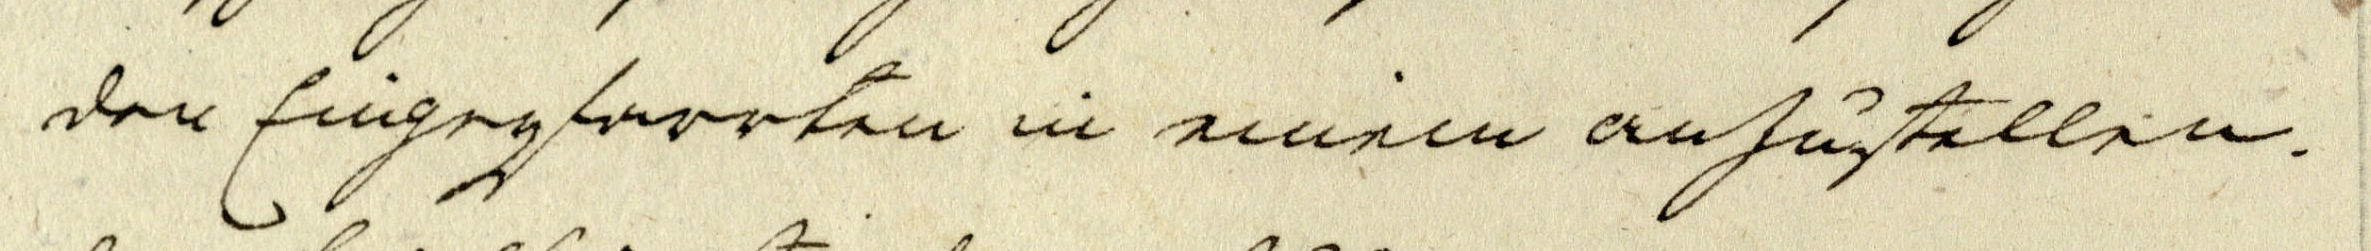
den Eingepfarrten in einem anzustellen¬
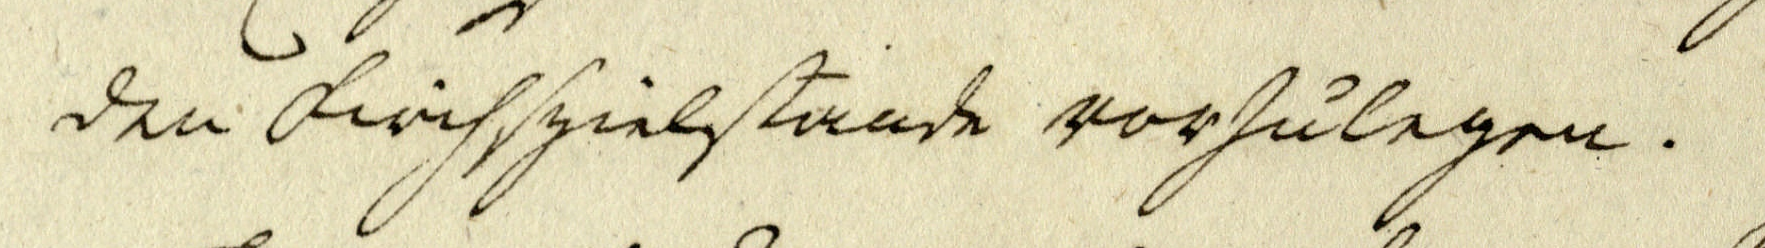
den Kirchspielstande vorzulegen.
